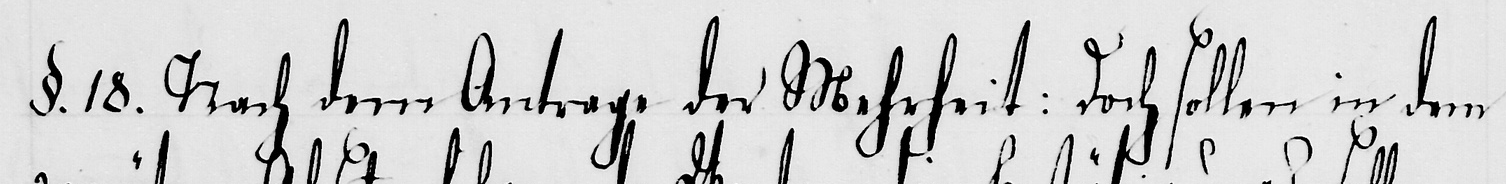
§. 18. Nach dem Antrage der Mehrheit: Doch sollen in dem
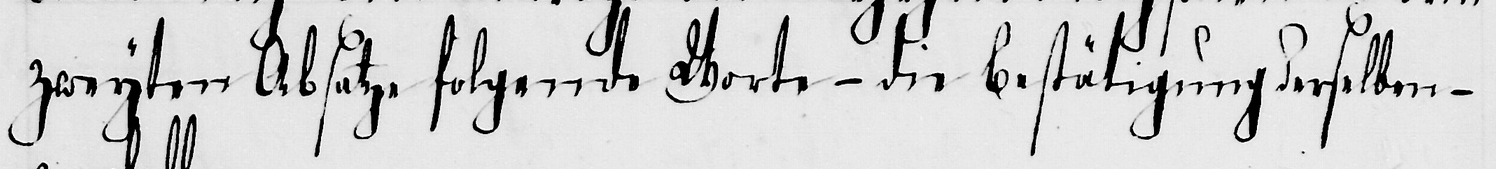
zweyten Absatze folgende Worte – die Bestätigung derselben –
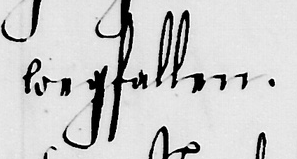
wegfallen.
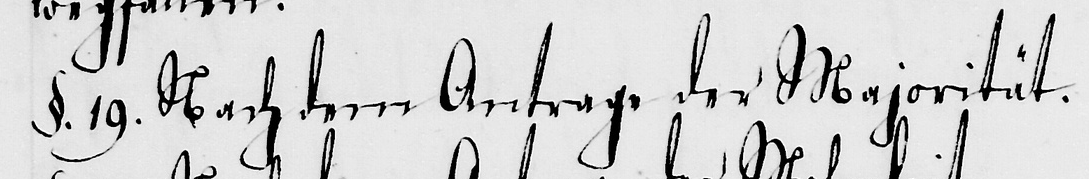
§. 19. Nach dem Antrage der Majorität.
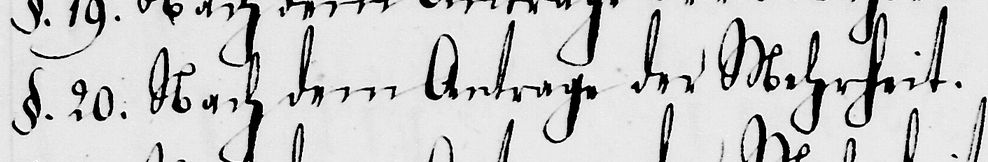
§. 20. Nach dem Antrage der Mehrheit.
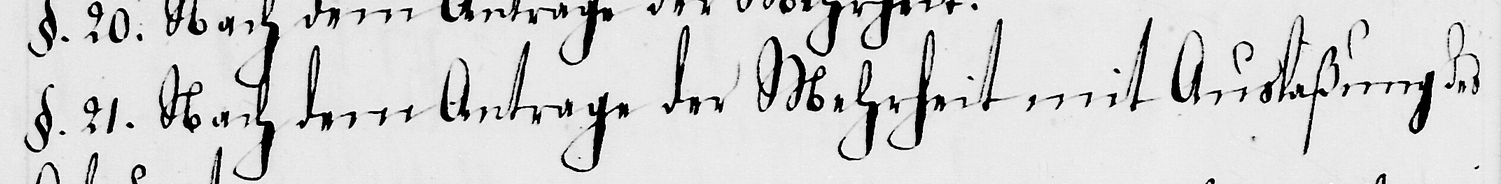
§. 21. Nach dem Antrage der Mehrheit mit Auslaßung des
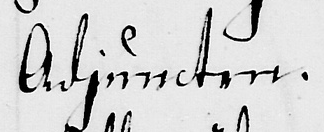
Adjuncten.
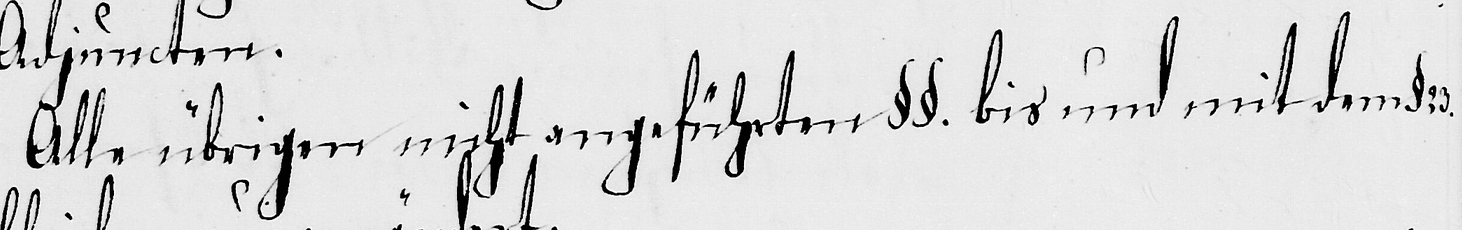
Alle übrigen nicht angeführten §§. bis und mit dem §.
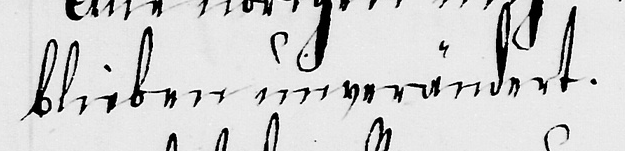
bleiben unverändert.
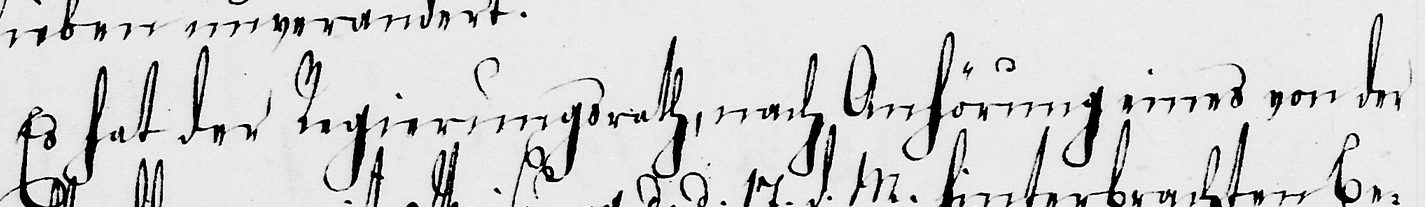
Es hat der Regierungsrath, nach Anhörung eines von der
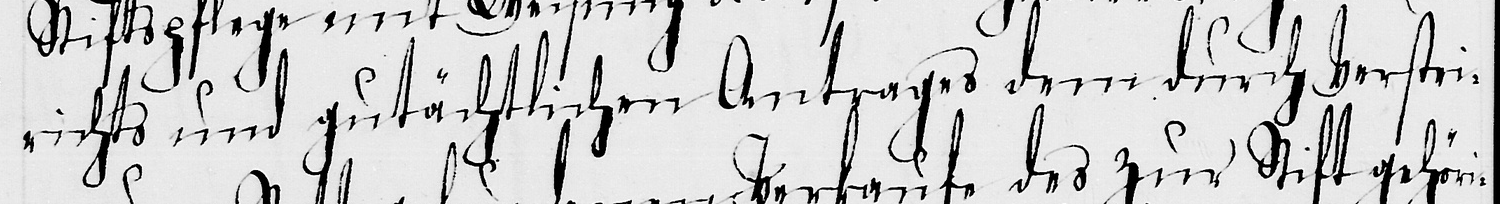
richts und gutächtlichen Antrages den durch Verstei¬
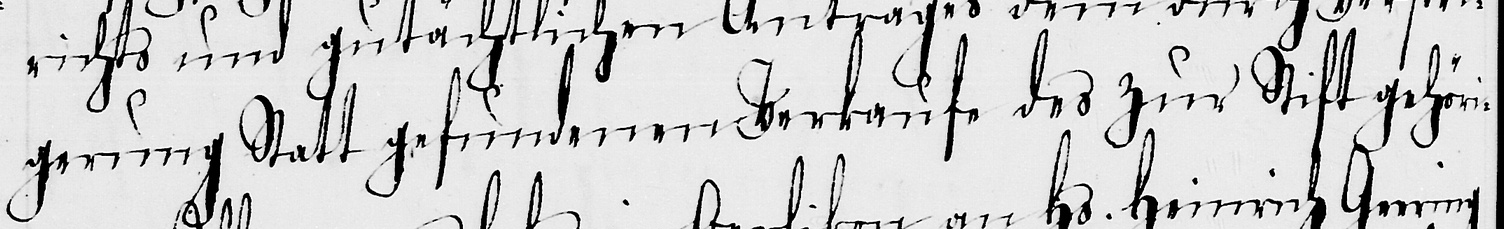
gerung Statt gefundenen Verkaufe des zur Stift gehöri¬
